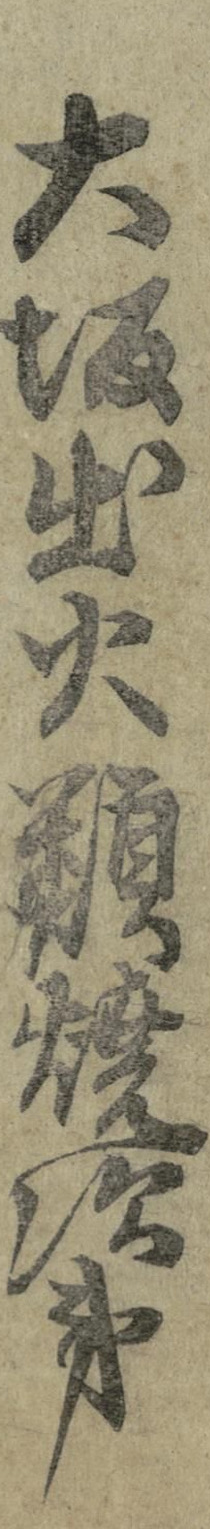大坂出火類焼次第
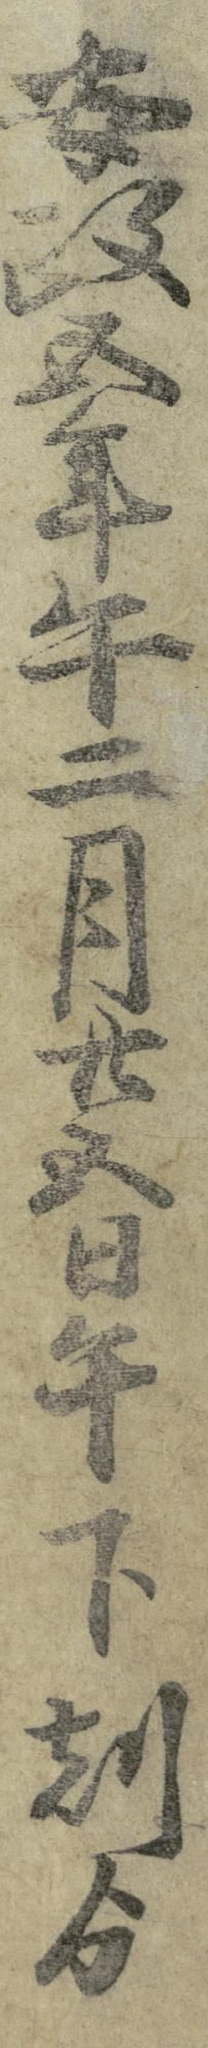安政五年午二月廿五日午下刻ゟ
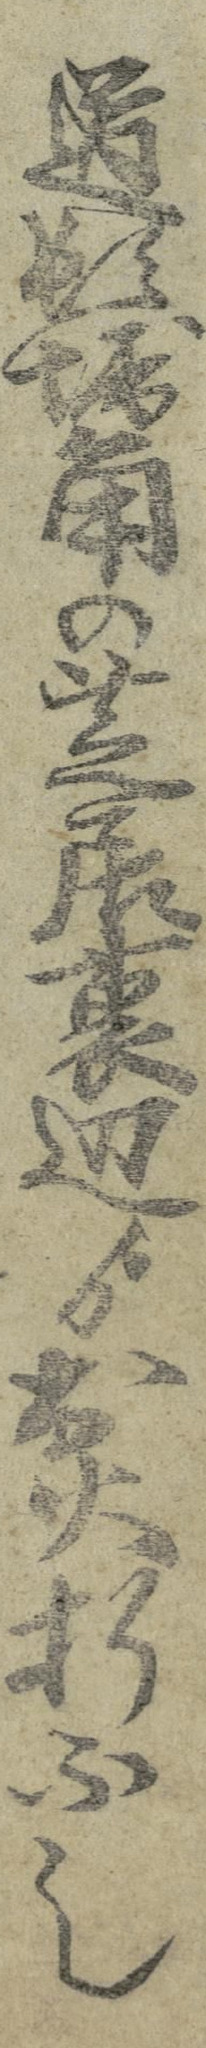道頓堀角の芝居裏辺ゟ出火折ふし
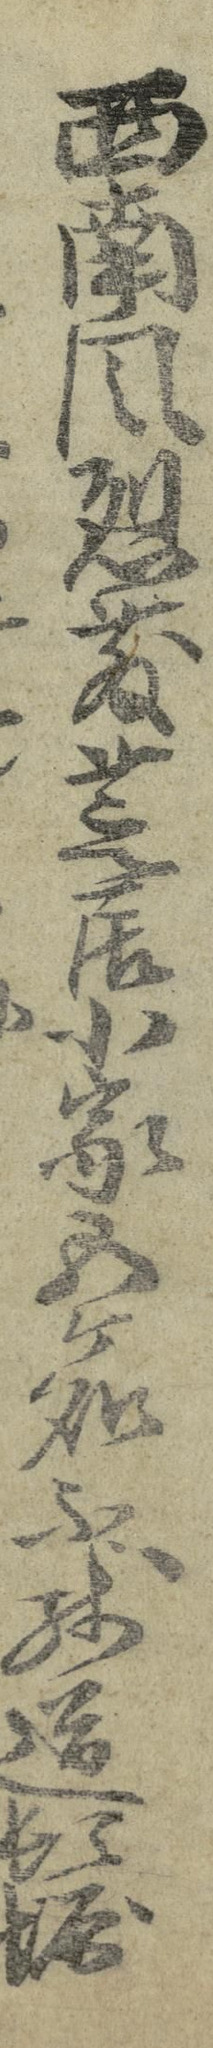西南風烈敷芝居小屋五ヶ処不残道頓堀
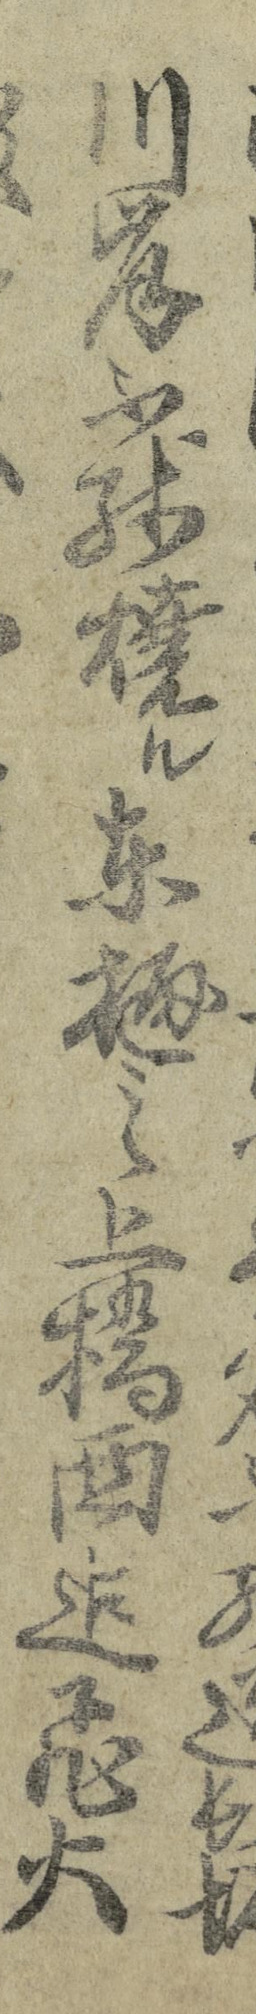川岸不残焼る東樋之上橋西迄飛火
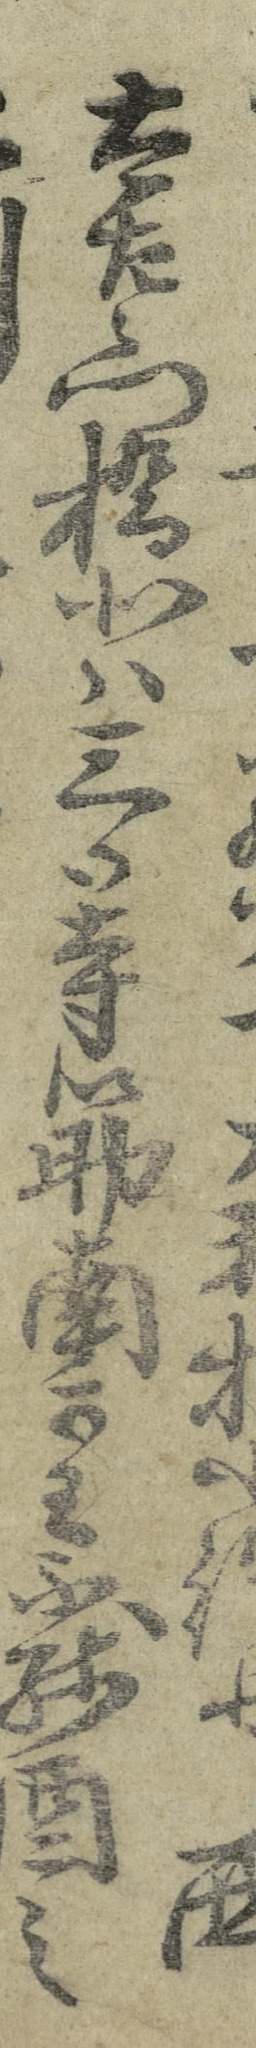太左衛門橋北は三い寺筋南かわ不残酉之
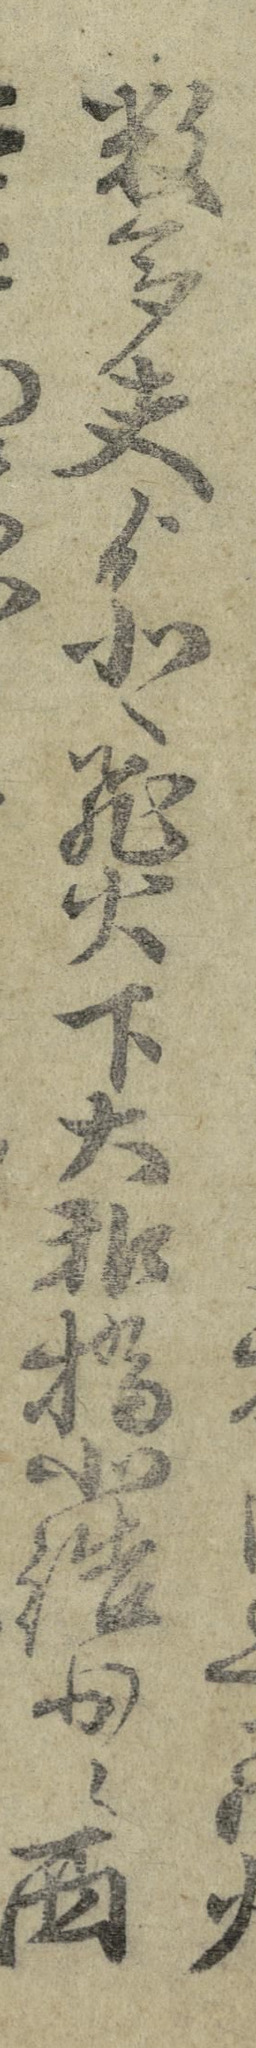数多夫ゟ北へ飛火下大和橋北詰から西
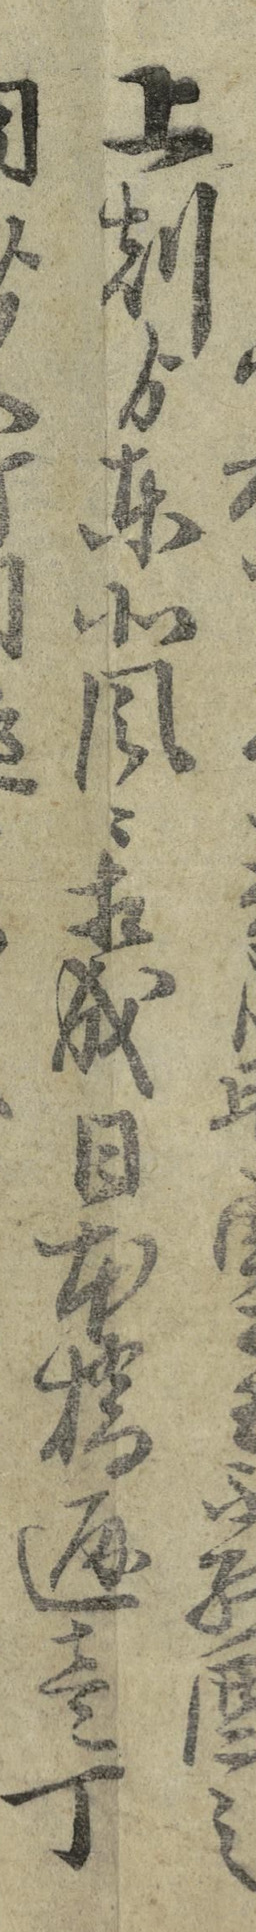上刻ゟ北東風に相成日本橋通壱丁
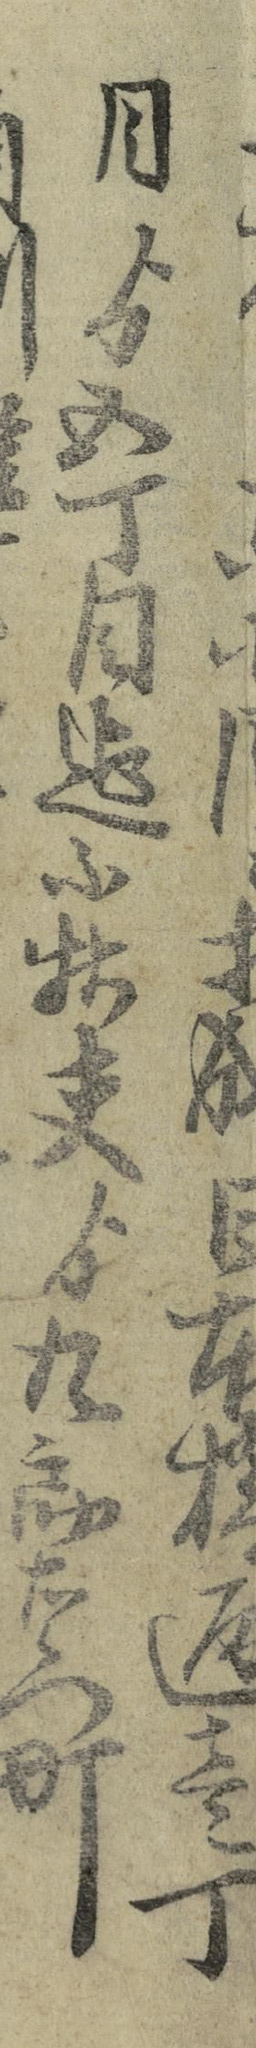目ゟ五丁目迄不残夫ゟ九郎右衛門町
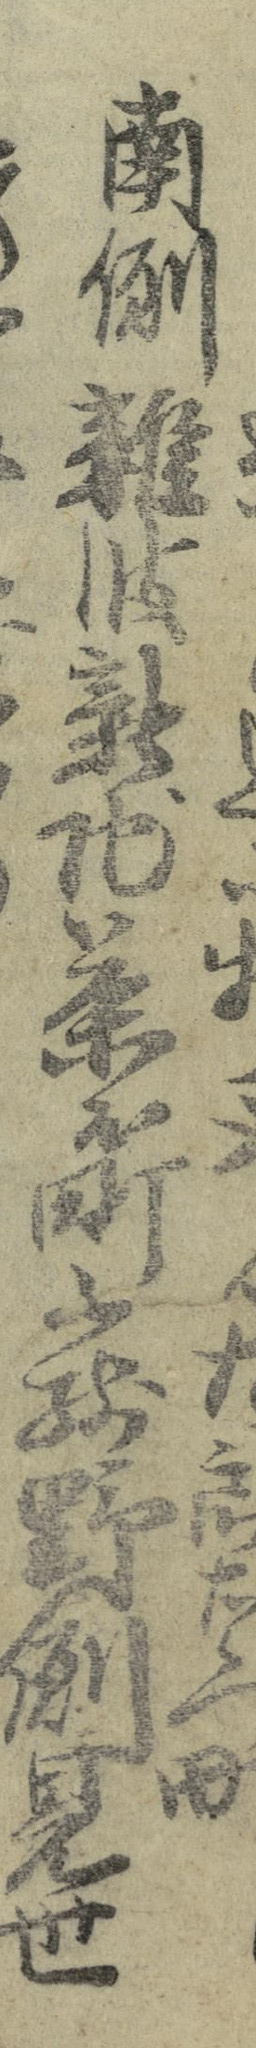南側難波新地茶屋町不残野例見世
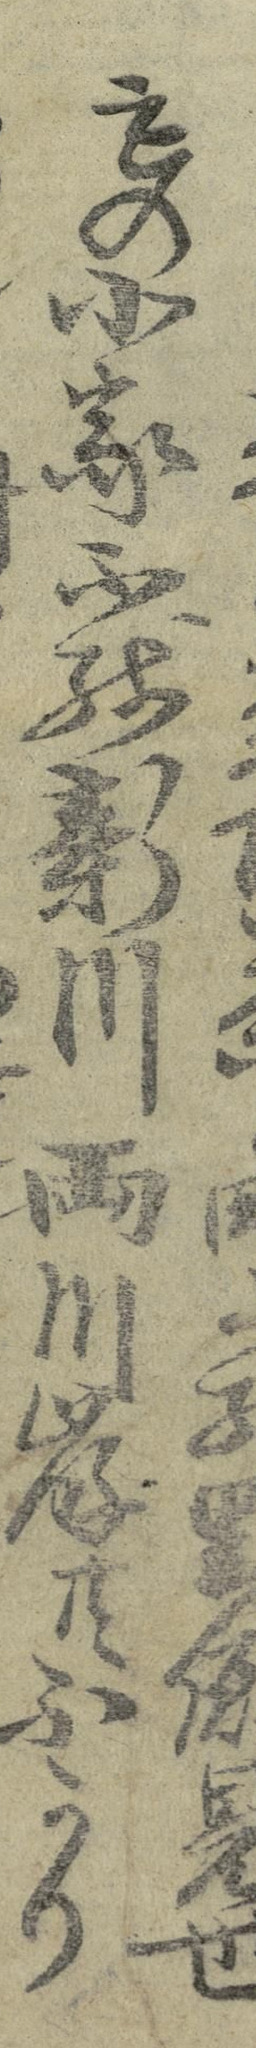もの小家不残新川両川岸共ふかり
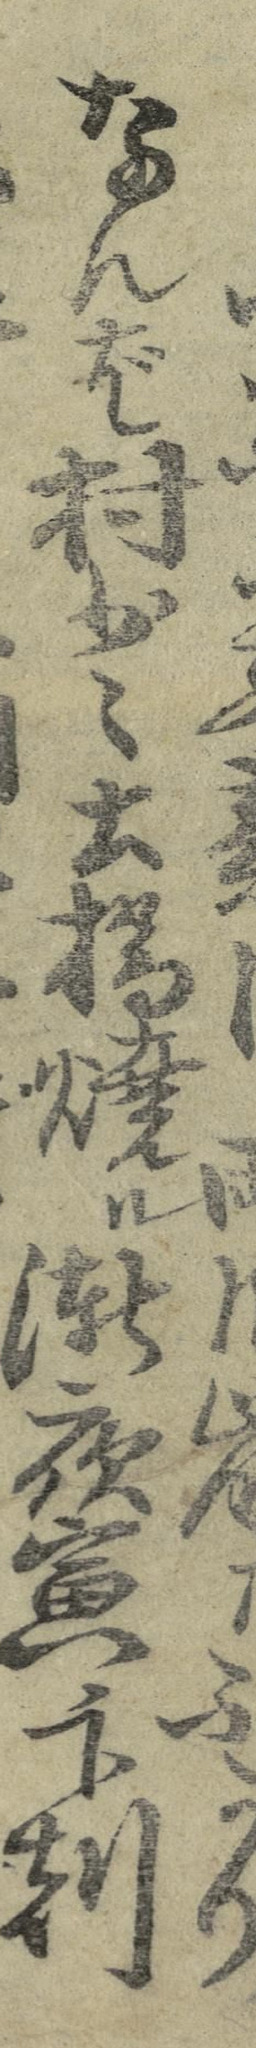なんば村少々土橋焼る漸夜寅下刻
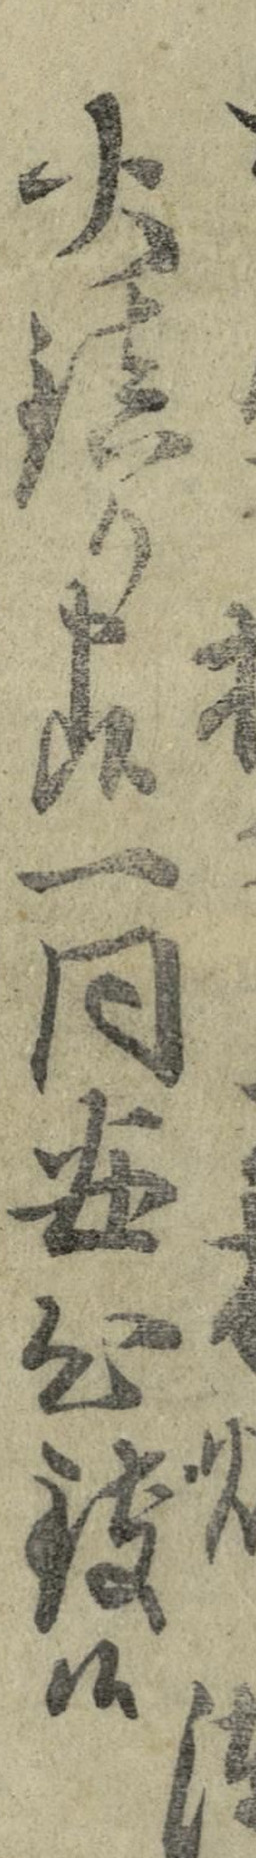火鎮り申候一同安心致候
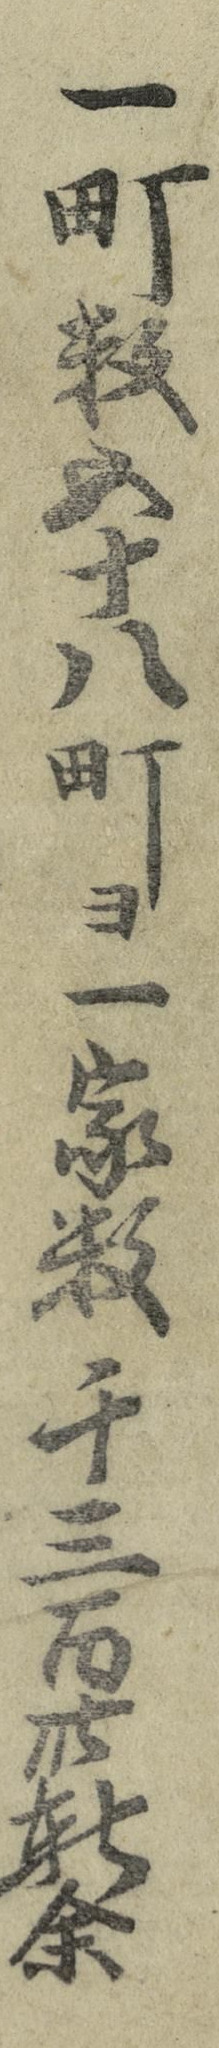一町数五十八町ヨ一家数千三百丗軒余
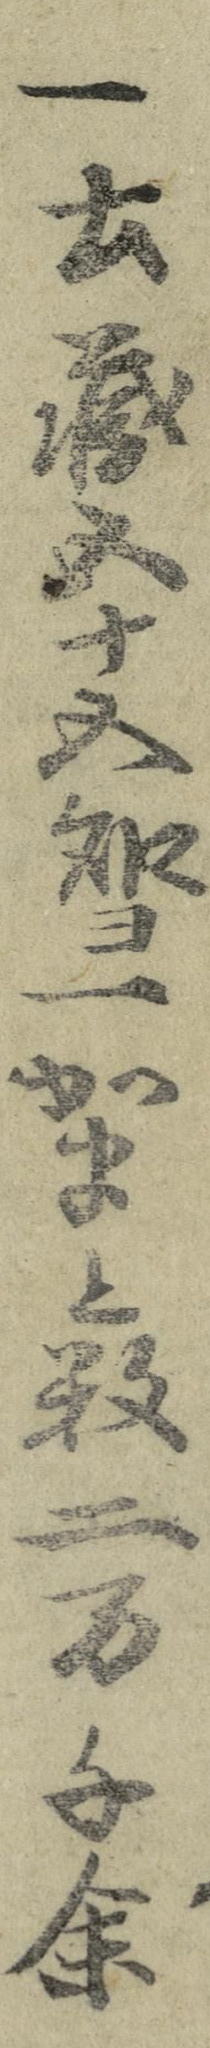一土蔵五十五処ヨ一かまと数二万千余
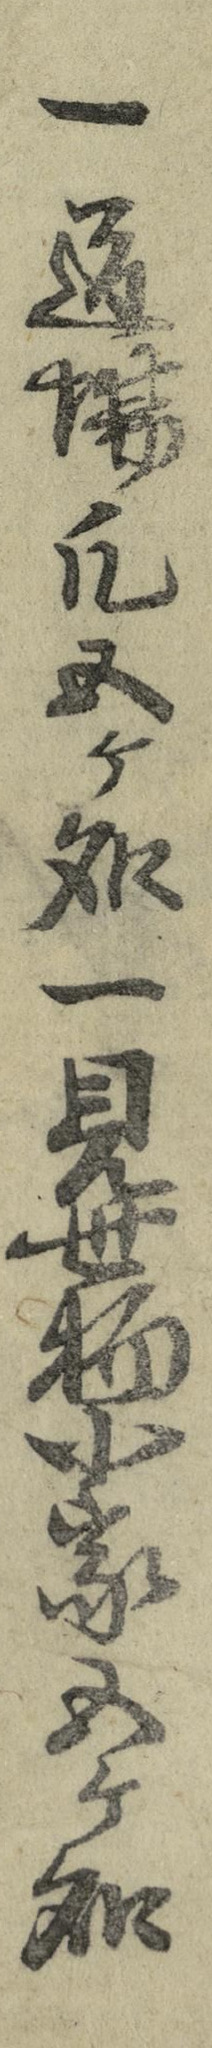一道場凡五ヶ処一見世物小家五ヶ処
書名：大阪大火本しらべ・大坂出火類焼次第
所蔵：東京大学地震研究所図書室 Earthquake Research Institute Library, The University of Tokyo, JAPAN
